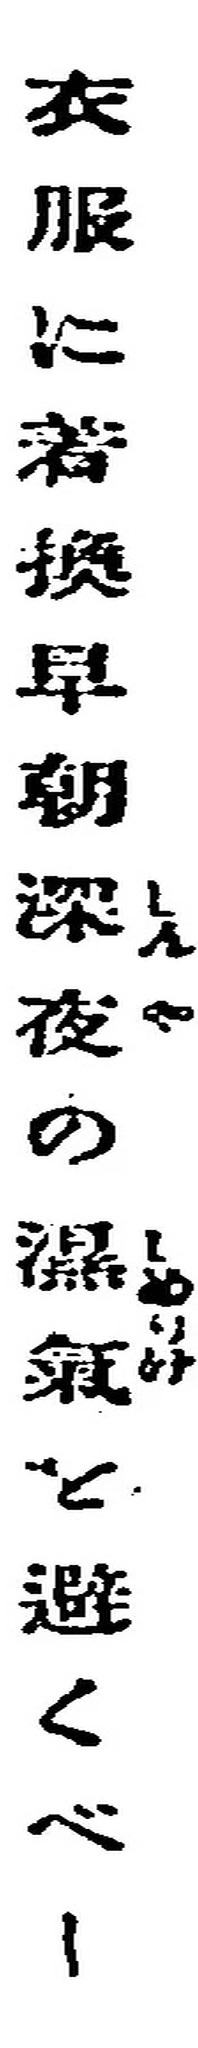衣服に着換早朝深夜の湿気を避くべし
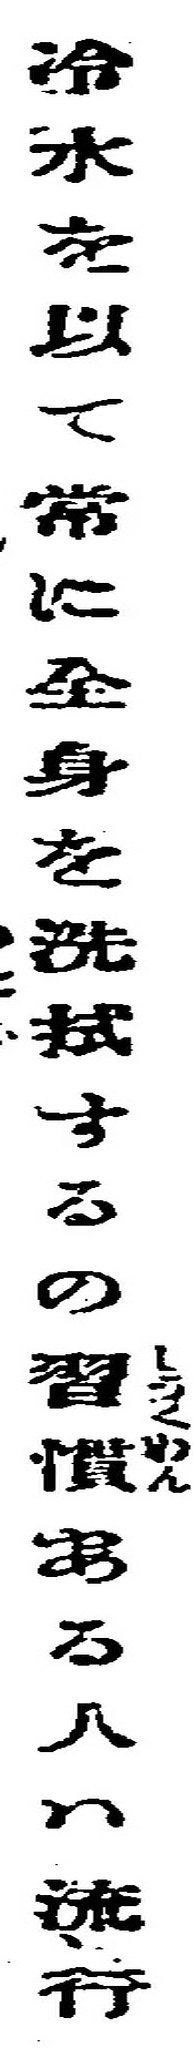冷水を以て常に全身を洗拭するの習慣ある人は流行
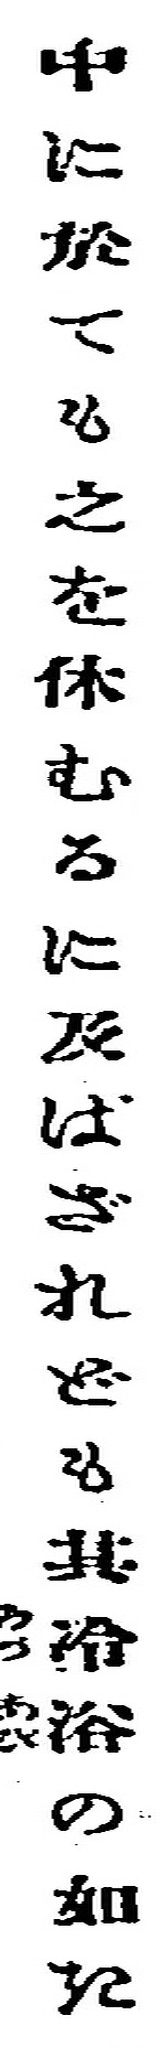中に於ても之を休むるに及ばざれども其冷浴の如き
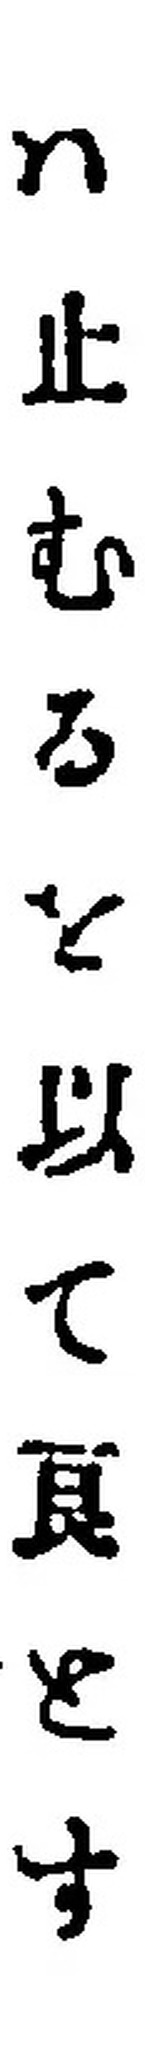は止むるを以て良とす
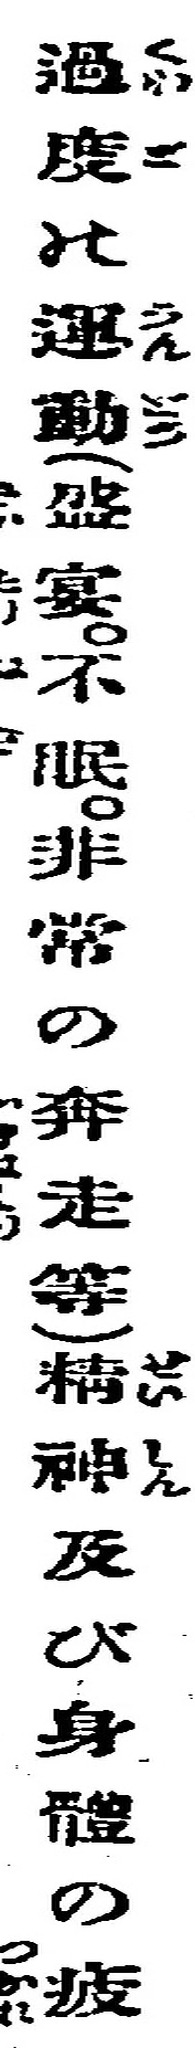過度の運動(盛宴。不眠。非常の奔走等)精神及び身体の疲
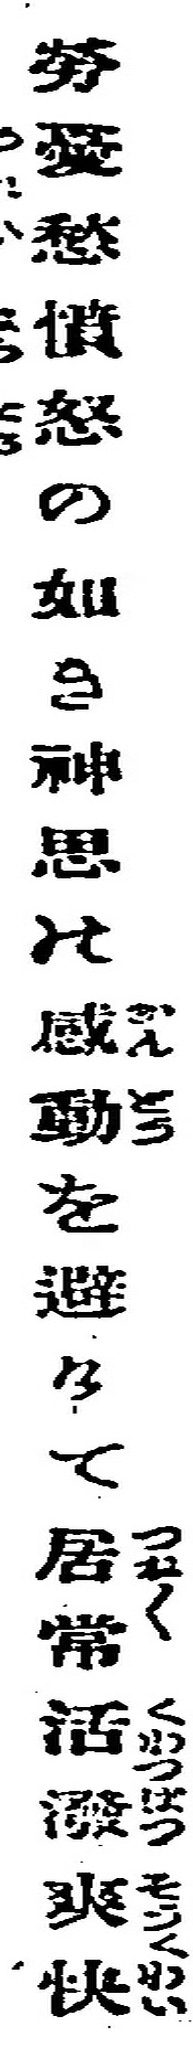労憂愁憤怒の如き神思の感動を避けて居常活溌爽快
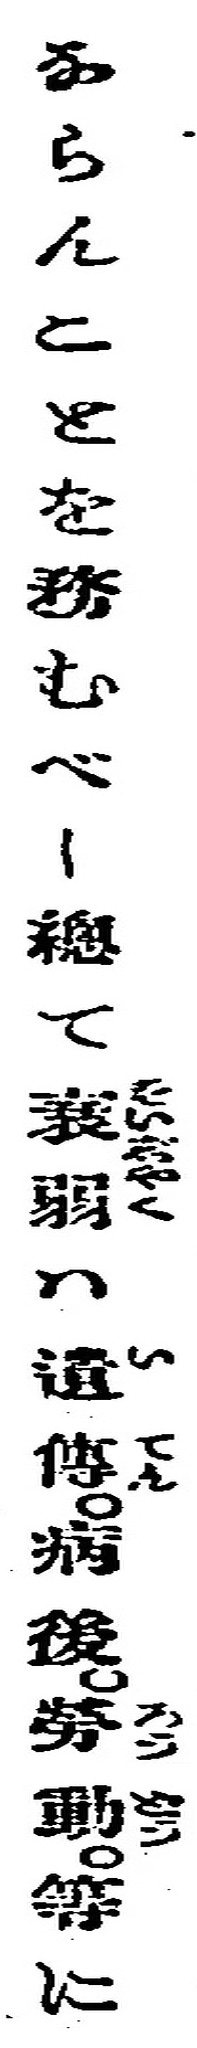ならんことを務むべし総て衰弱は遺伝。病後。労動。等に
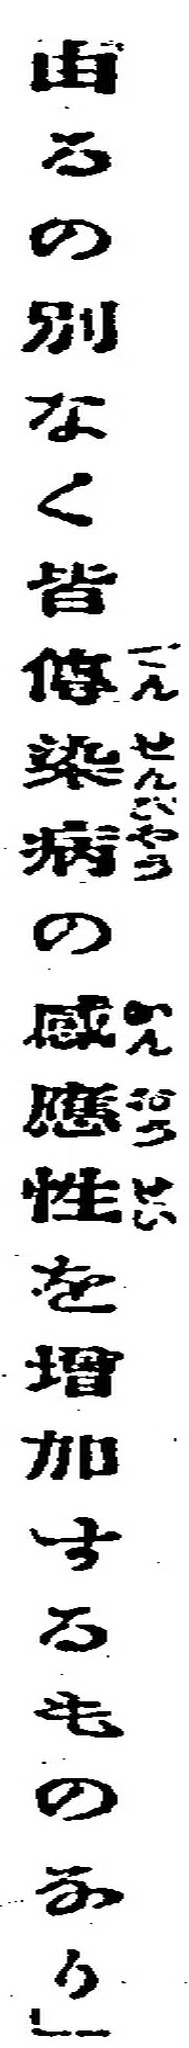由るの別なく皆伝染病の感応性を増加するものなり」
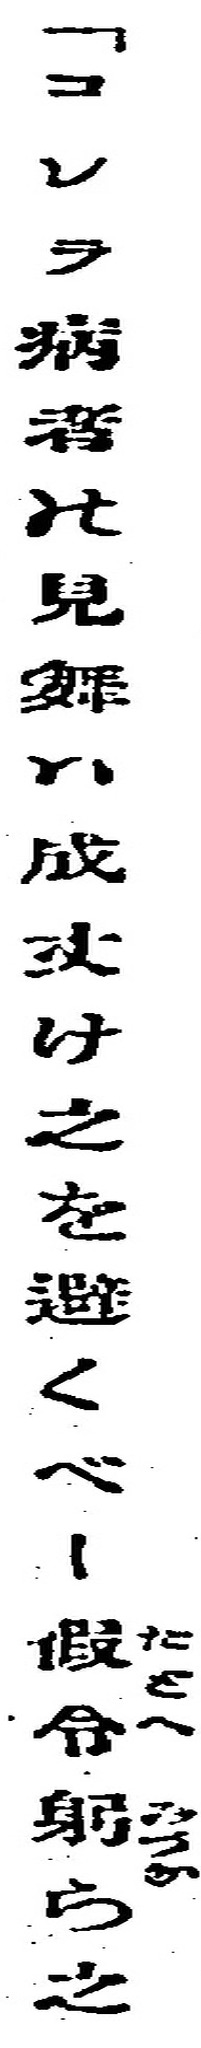「コレラ病者の見舞は成丈け之を避くべし仮令躬ら之
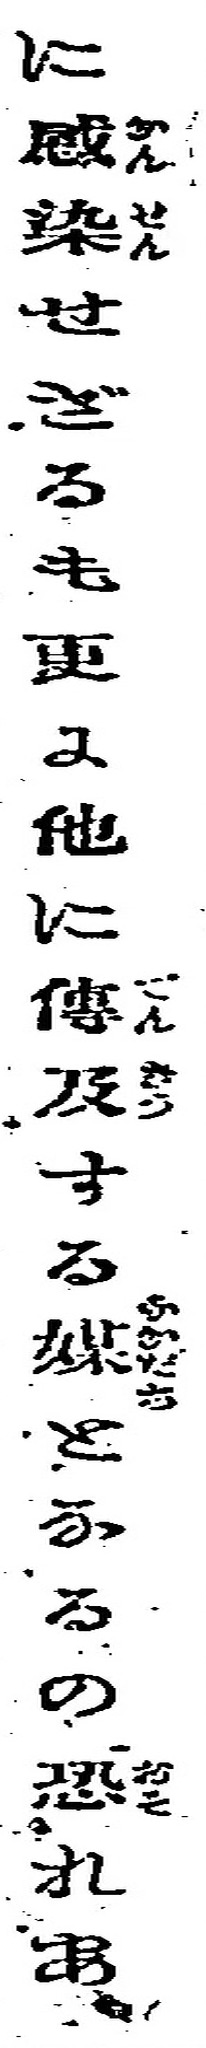に感染せざるも更に他に伝及する媒となるの恐れあ
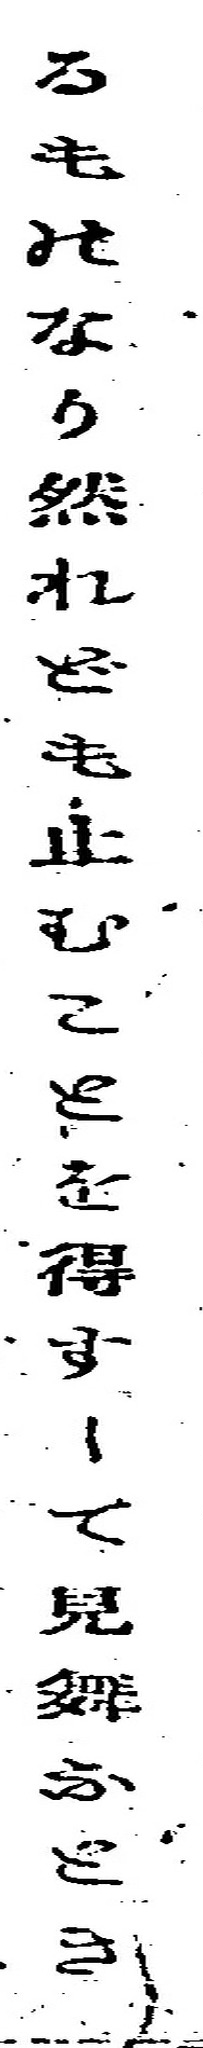るものなり然れども止むことを得すして見舞ふとき
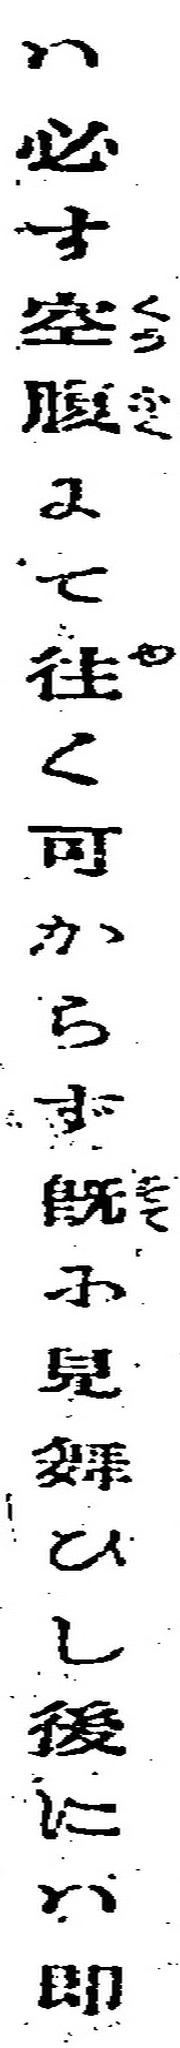は必す空腹にて往く可からず既に見舞ひし後には即
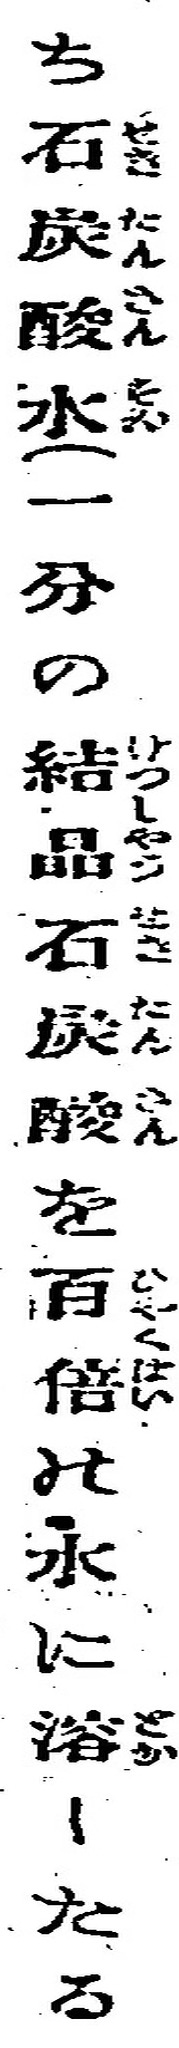ち石炭酸水(一分の結晶石炭酸を百倍の水に溶したる
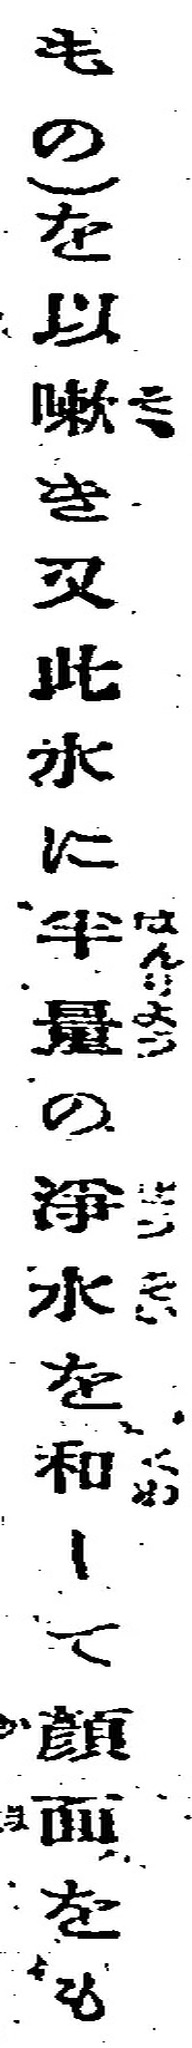もの)を以嗽き又此水に半量の浄水を和して顔面をも
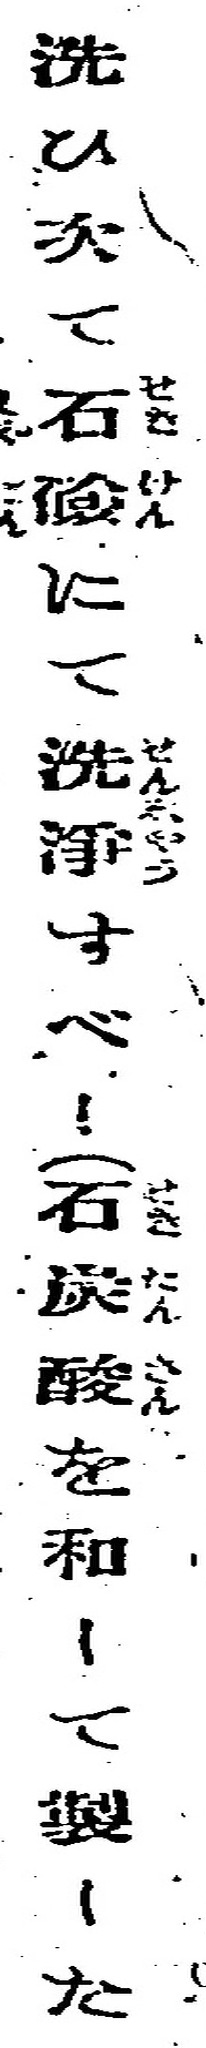洗ひ次て石鹸にて洗浄すべし(石炭酸を和して製した
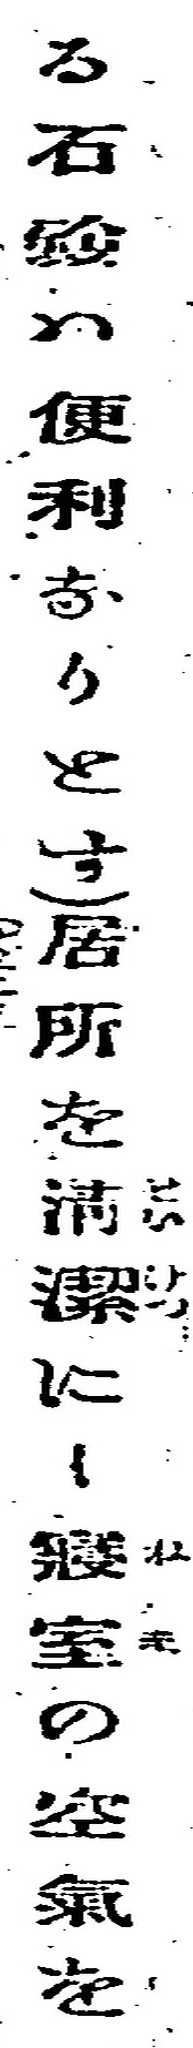る石鹸は便利なりとす)居所を清潔にし寝室の空気を
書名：これら病予防心得
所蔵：国立国会図書館 National Diet Library, JAPAN
